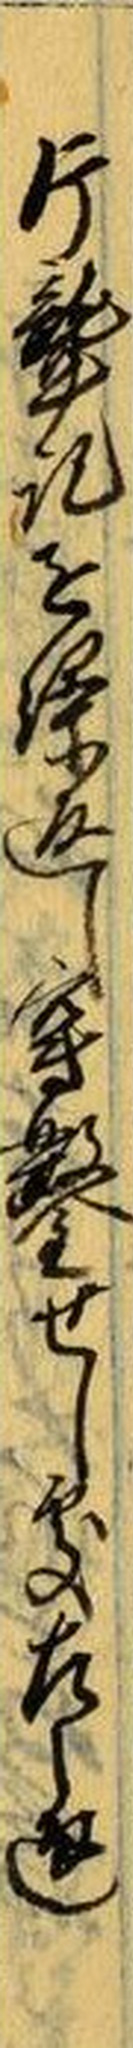片聾記を繰返し穿鑿せし処左之通
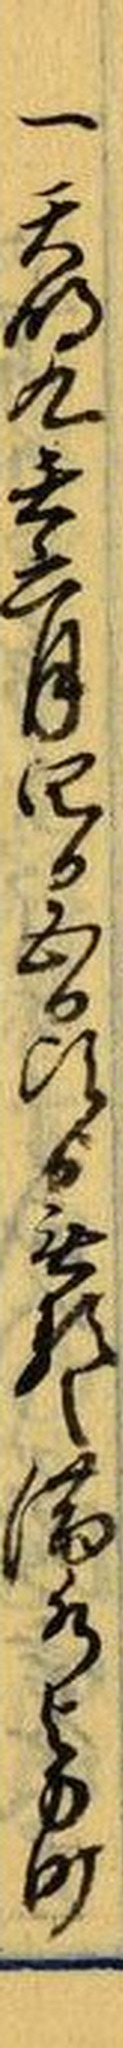一天明九閏六月四日五日頃ゟ無類之満水与力町
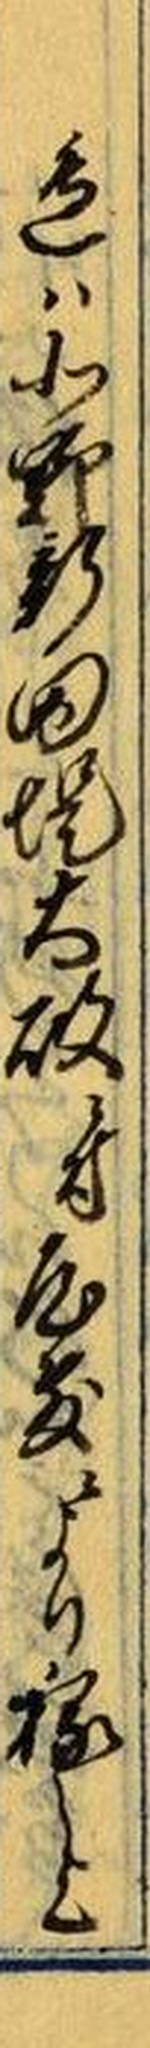辺ハ北野新田堤大破ニ付屋敷ニより縁之上
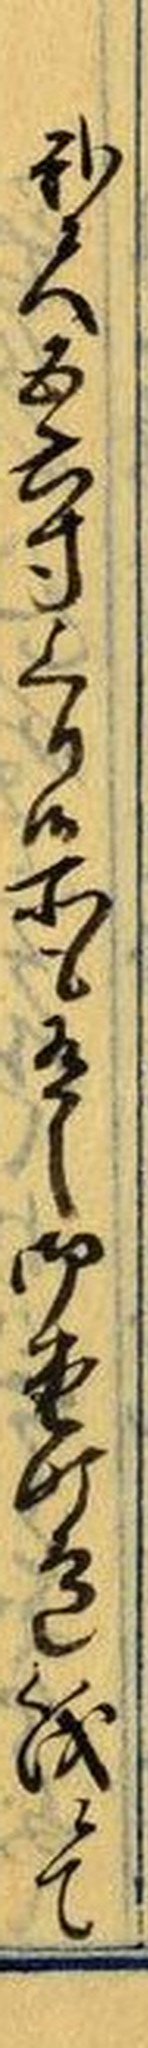弐尺五六寸上り候所も有之御堂町辺筏ニて
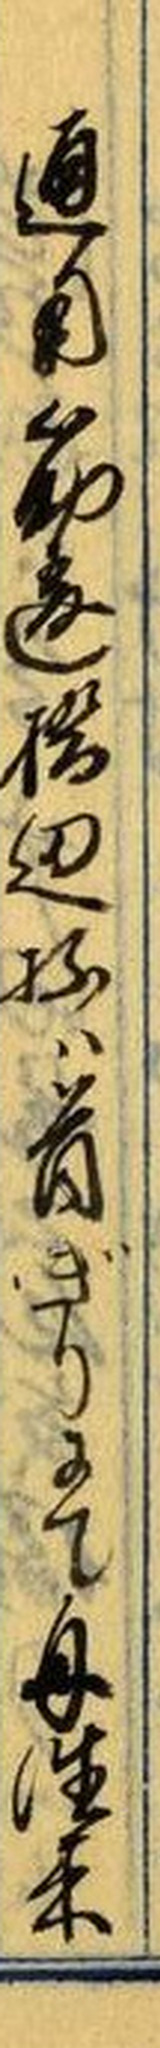通用筋違橋辺抔ハ首ぎりにて舟往来
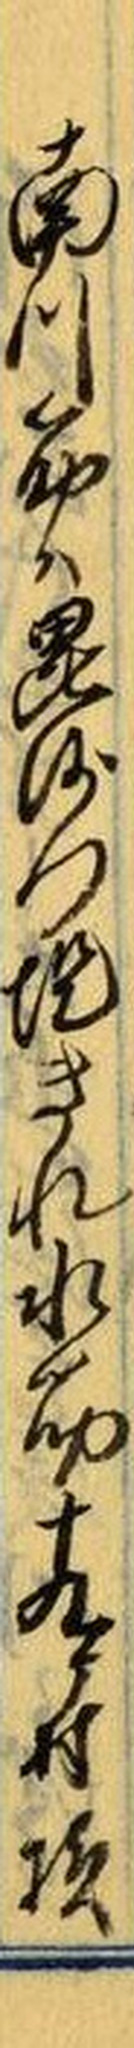南川筋ハ毘沙門堤きれ水筋十九ヶ村損
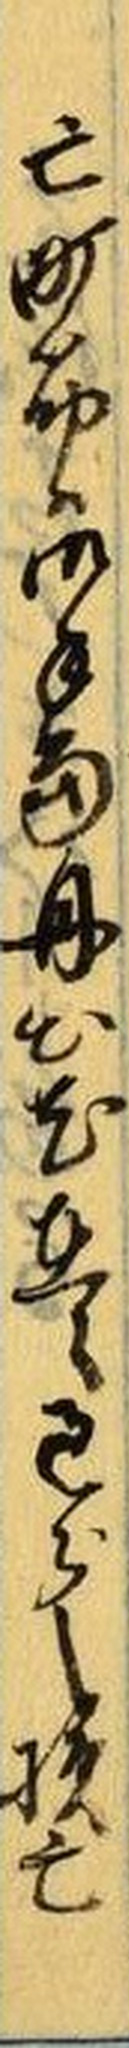亡町筋ハ御手当舟出尤在々過分之損亡
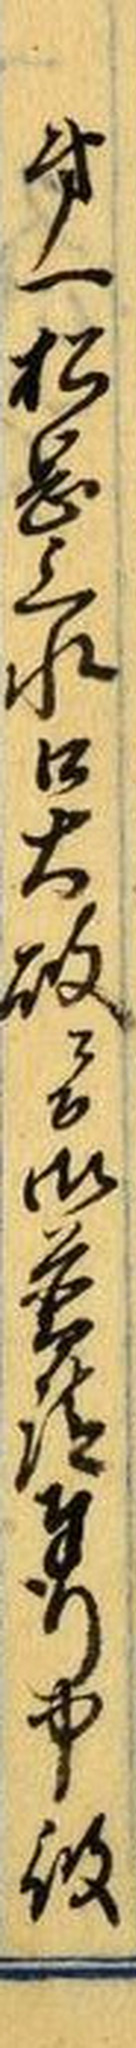第一松岡上水口大破ニ而御普請奉行中彼
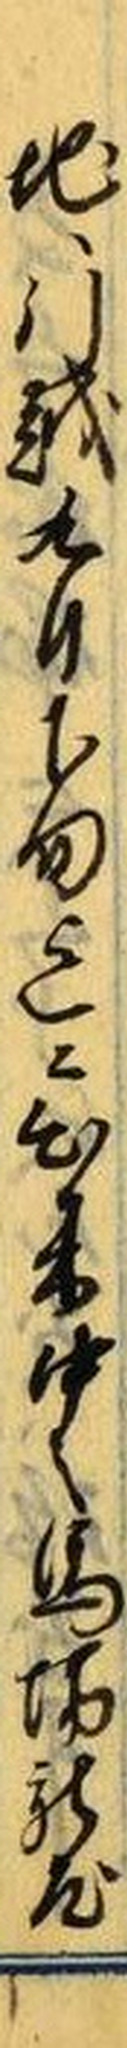地へ引越九月下旬迄ニ出来中之馬場新屋

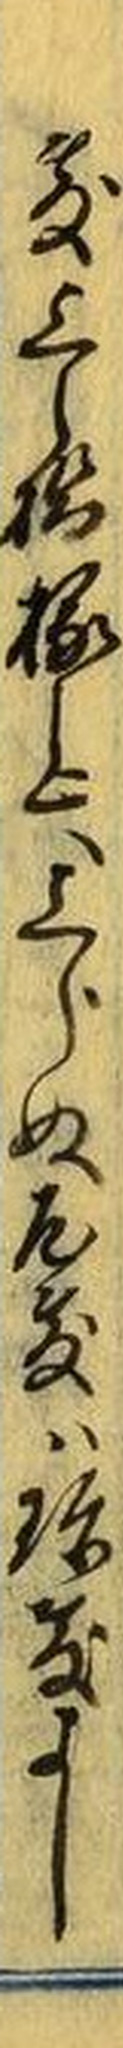敷上之橋縁之上へ上らぬ屋敷ハ珍敷よし
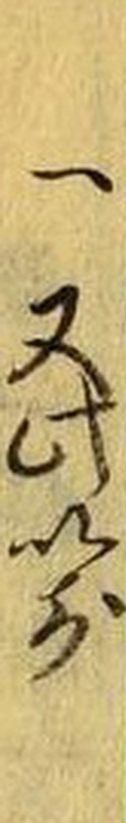一又此以前
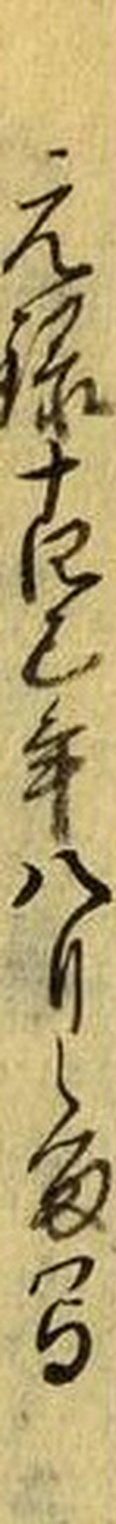元禄十四巳年八月之留写
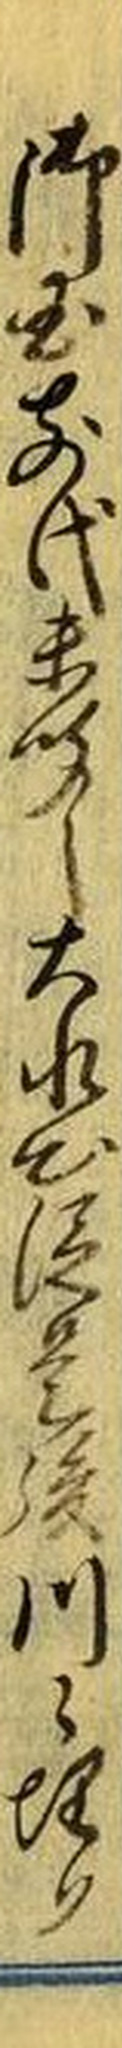御国前代未聞之大水出従是後川々埋り
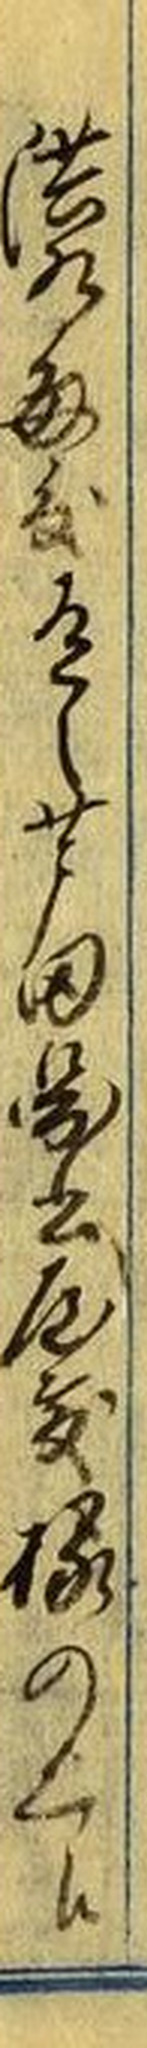洪水毎度有之芦田図書屋敷縁之上江
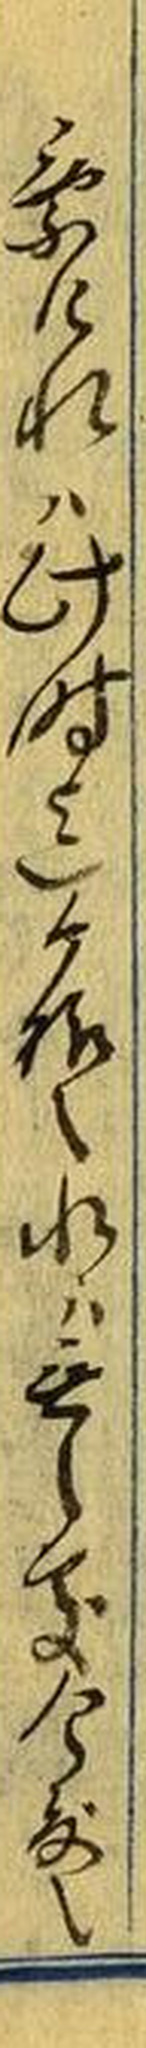乗けれハ此時迄ヶ様之水ハ無之処今度之
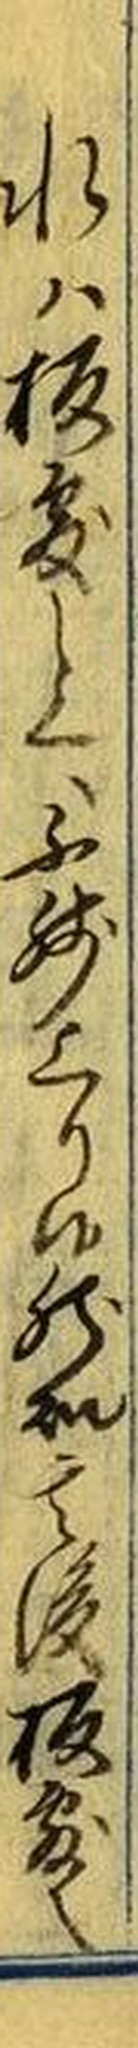水ハ板敷之上へ不残上り候然処其後板敷へ
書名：温古集 五巻
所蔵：福井県文書館 Fukui Prefectural Archives
